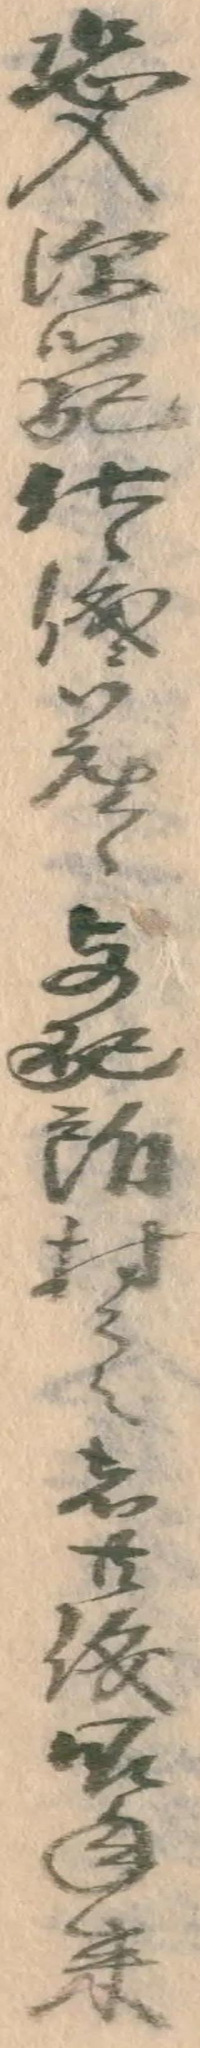恐入深心配仕候義ニ御座候支配所村々之者共儀昨年来
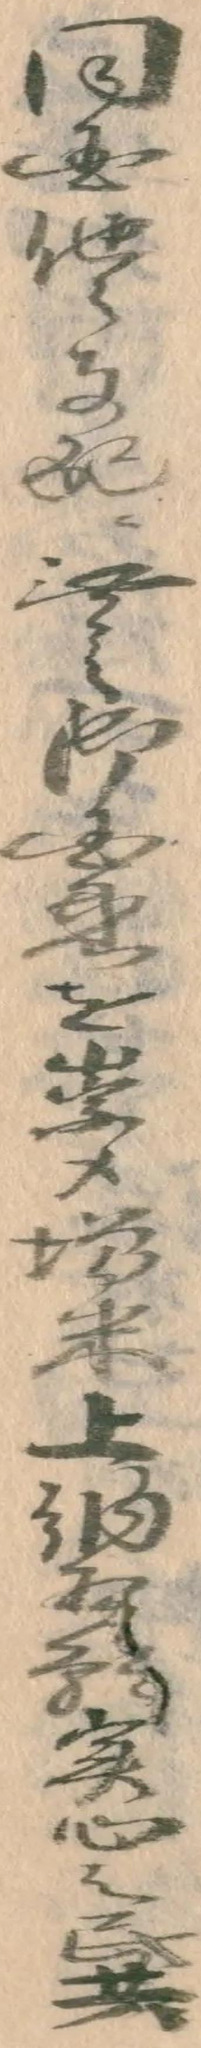同国他之支配所ニ無之御国恩を定め増米上納相願候実心之民共
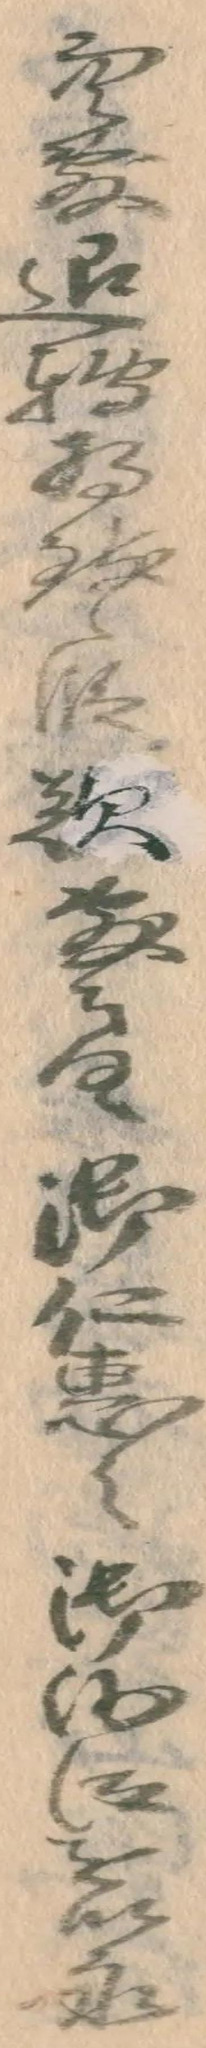穴敷退転為致候段歎敷奉存候御仁恵之御沙汰ヲ以永
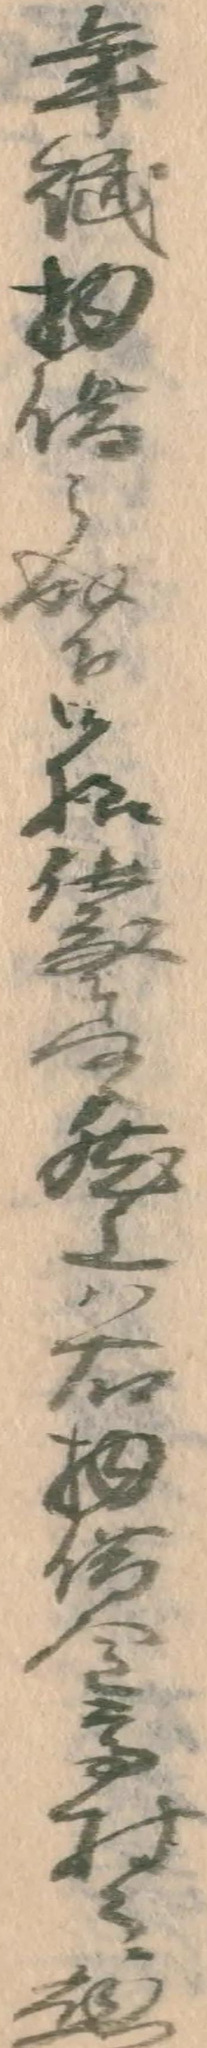年賦拝借被成下候様仕度奉存候然上ハ右拝借金高村々ニ応
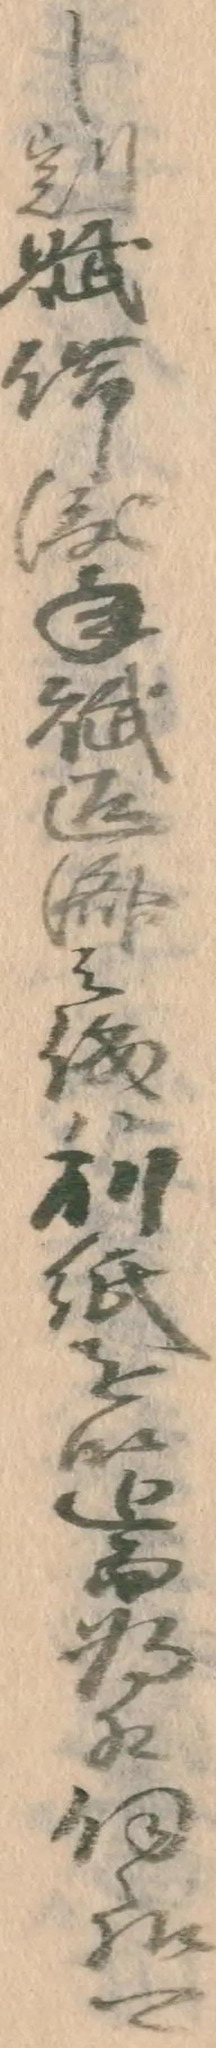し割賦貸渡年賦返納之儀ハ別紙を以追而為相伺候様可
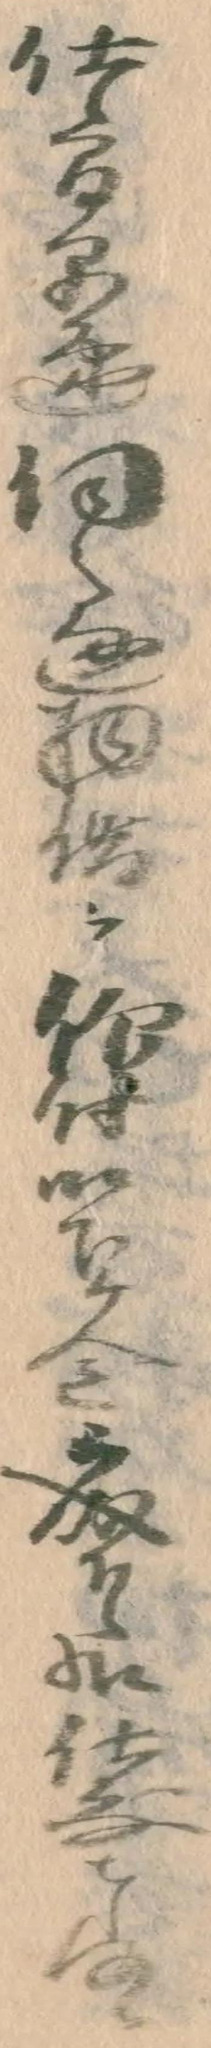仕候間早速伺之通拝借被仰付御下ケ金被成下候様仕度奉存候
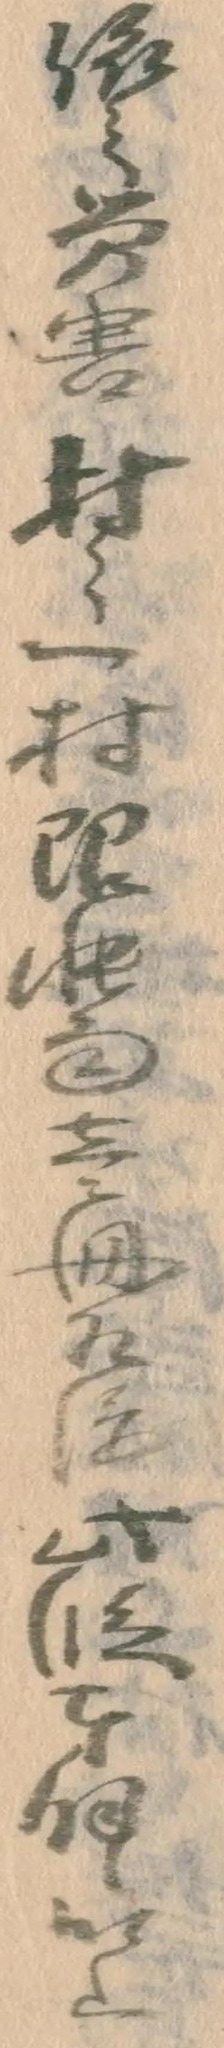依之災害村々一村限帳面壱冊相添此段奉伺候以上
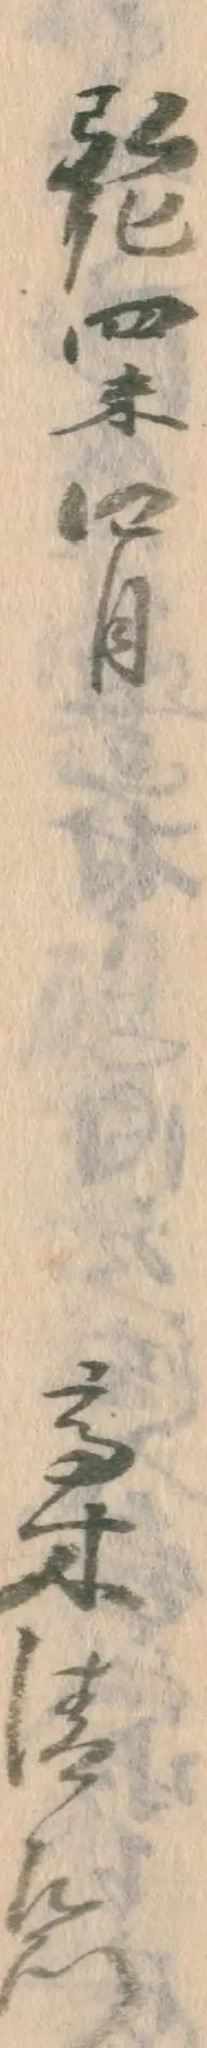弘化四未四月高木清左衛門
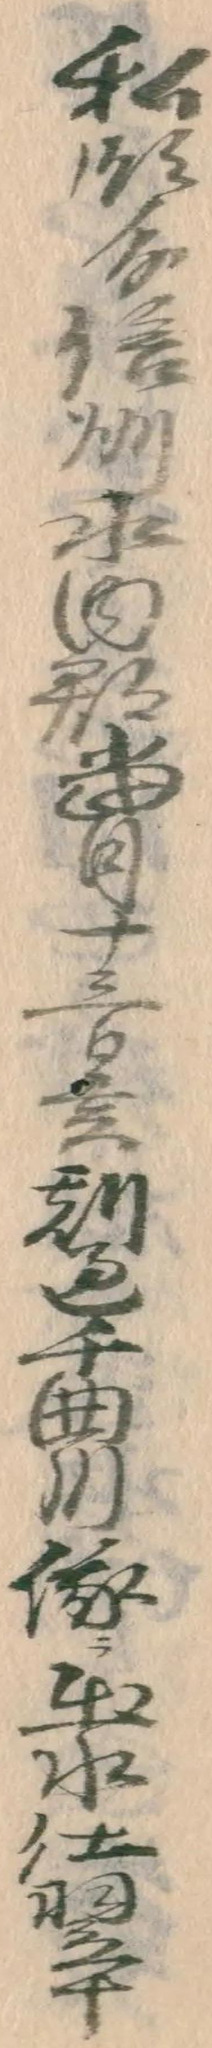私領分信州水内郡当月十三日亥刻千曲川俄二出水仕翌十
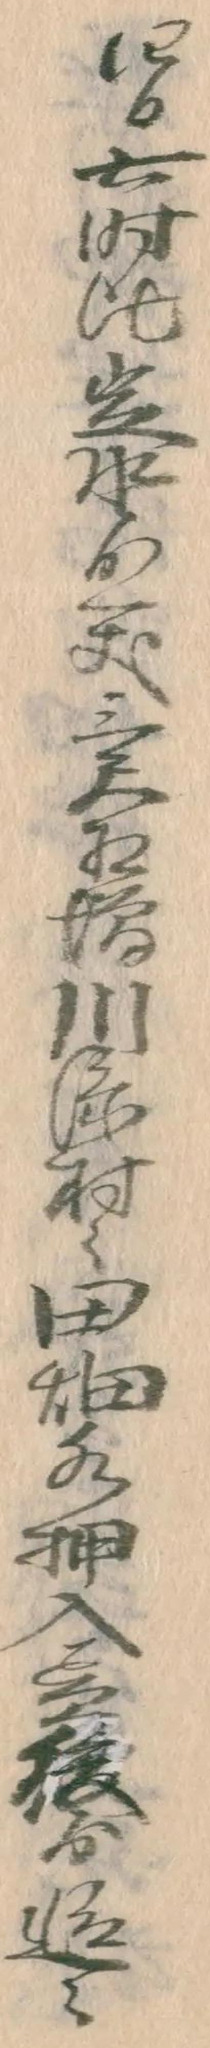四日六時比定水ゟ一丈三尺相増川添村々田畑水押入昼後ゟ追々
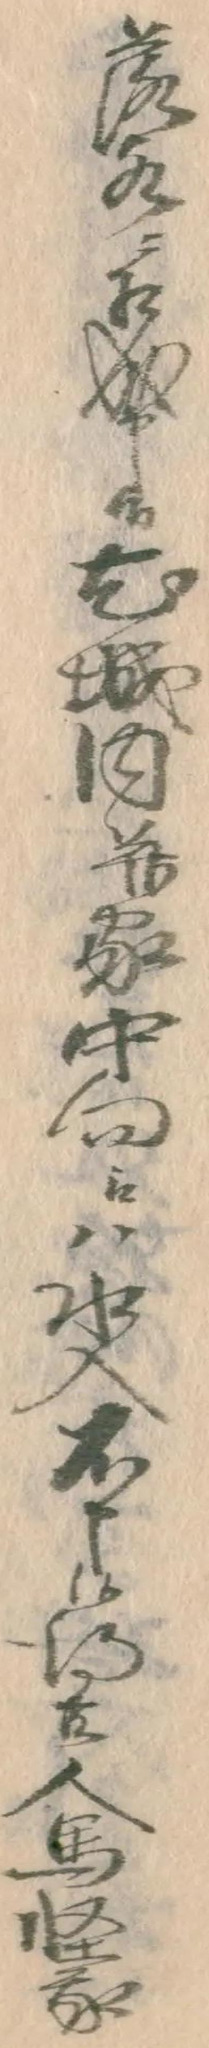落水二相成申候尤城内并家中向江ハ水入不申候得共人馬怪我
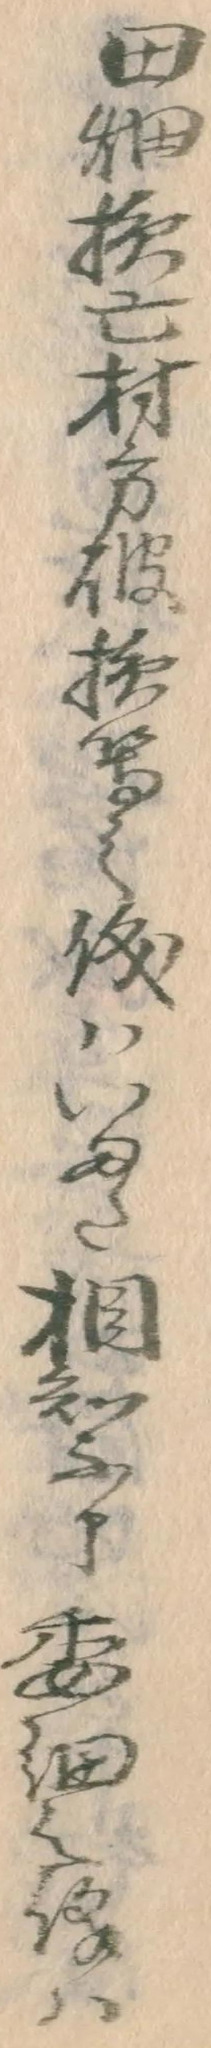田畑損亡村方破損等之儀ハいまた相知不申委細之儀ハ
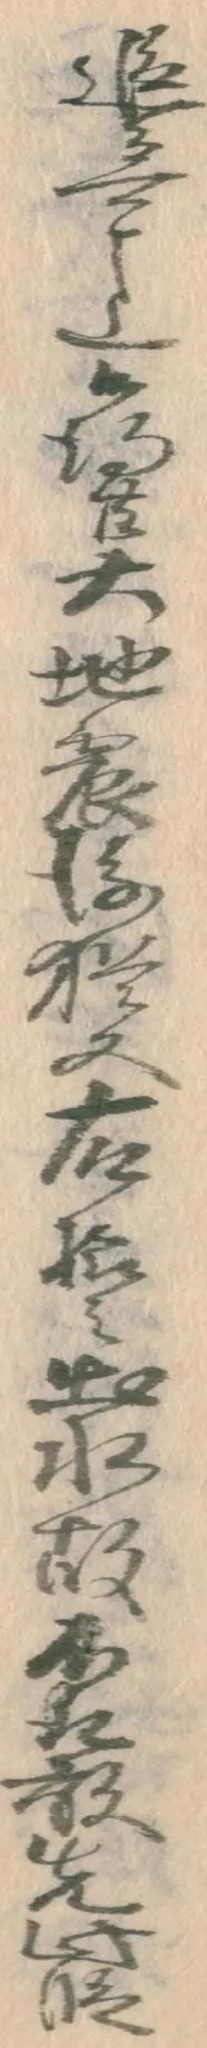追而可申上候得共大地震後猶又右様之出水故不取敢先此段
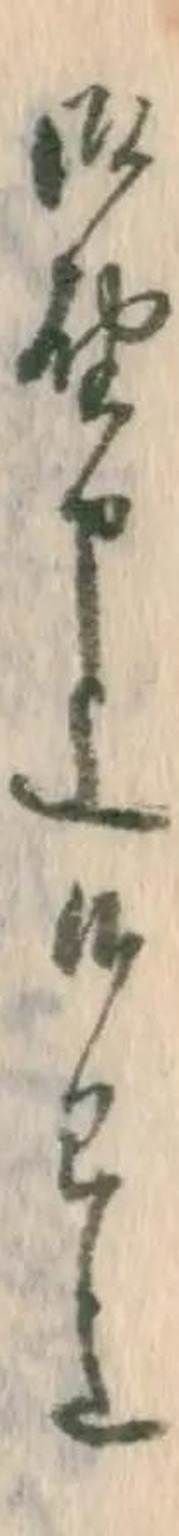御届申上候い已上
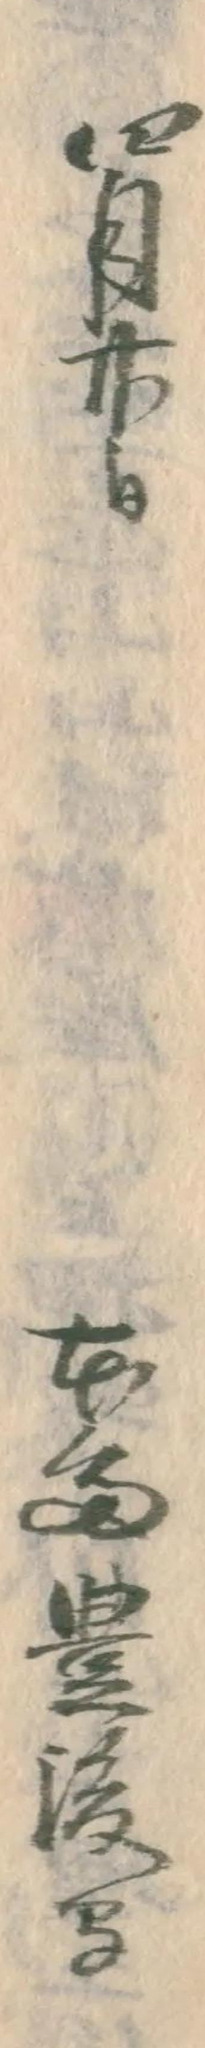四月廿日本多豊後守
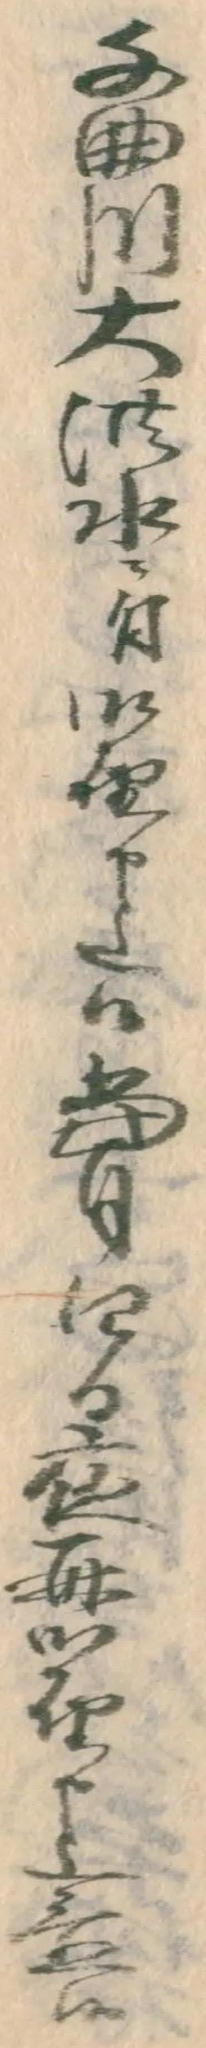千曲川大洪水二付御届申上候当月四日夜再御届申上置候
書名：信州大地震之記
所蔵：国立国会図書館 National Diet Library, JAPAN
